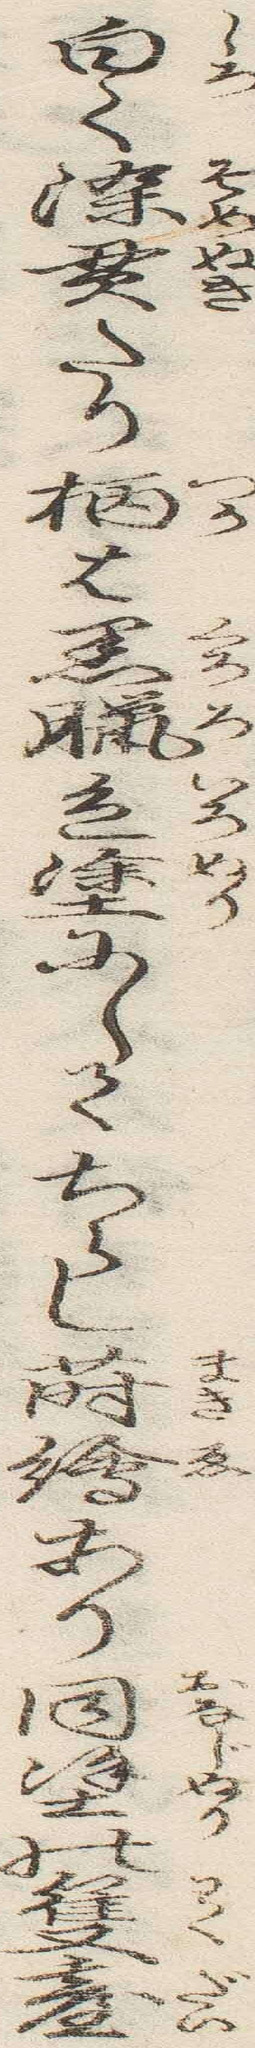白く染貫たり柄は黒臘色塗にしてちらし莳繪あり同塗の篗臺
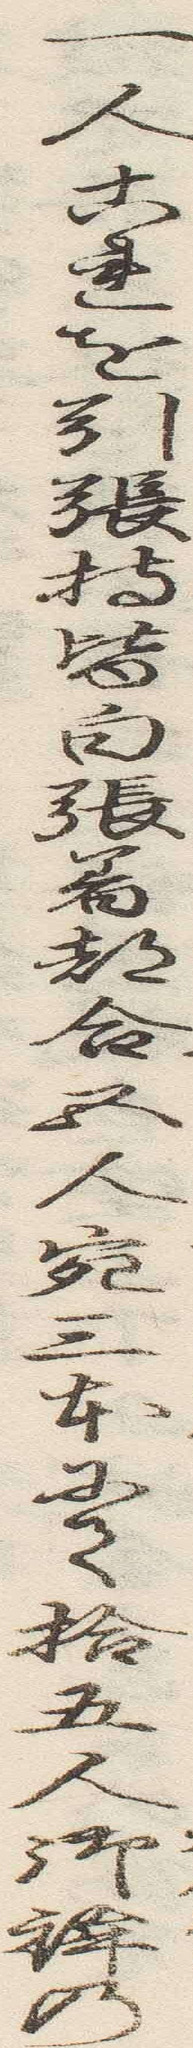一人これを引張持皆白張着都合五人宛三本にて拾五人御鉾の
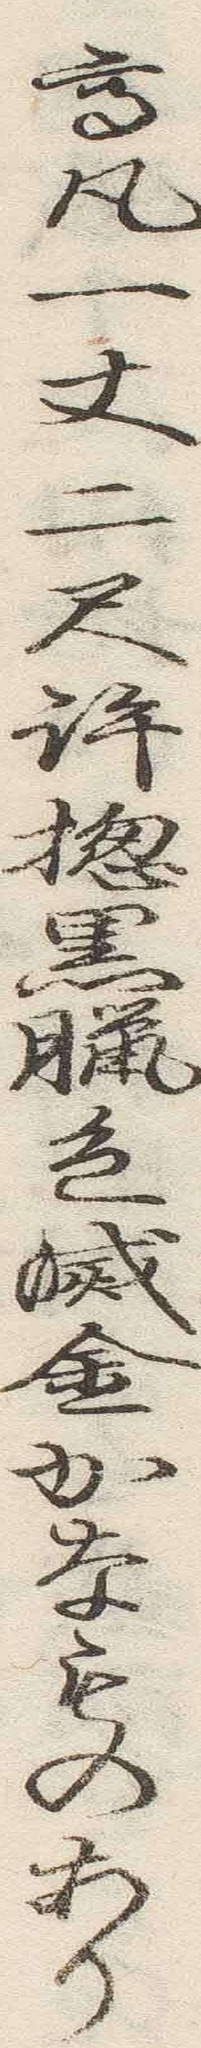高凡一丈二尺許揔黒臘色滅金かなものあり
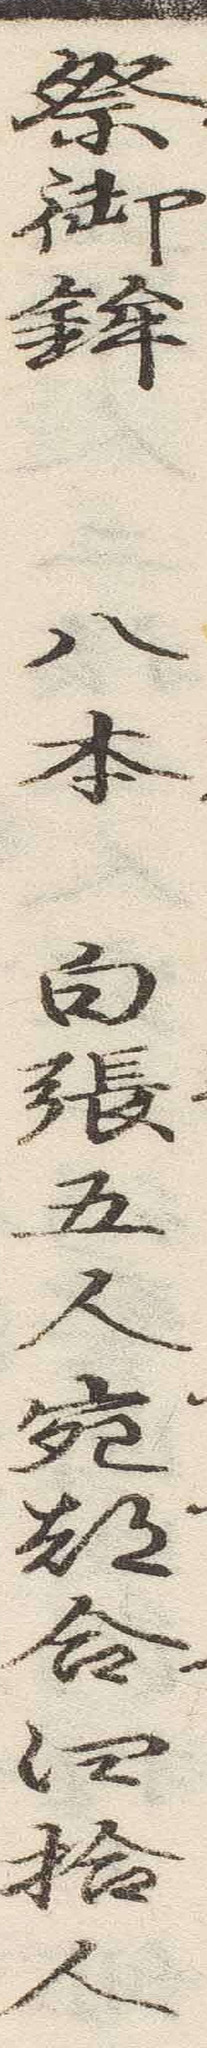祭御鉾八本白張五人宛都合四拾人
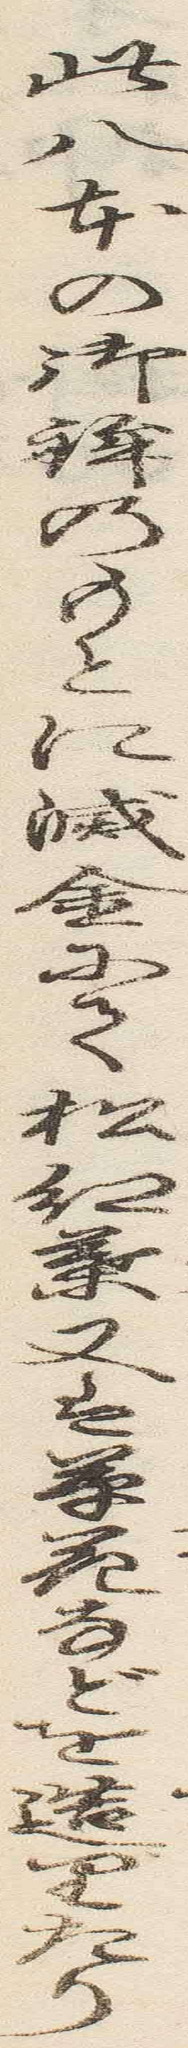此八本の御鉾のもとに滅金にて松紅葉又は草花などを造りたり
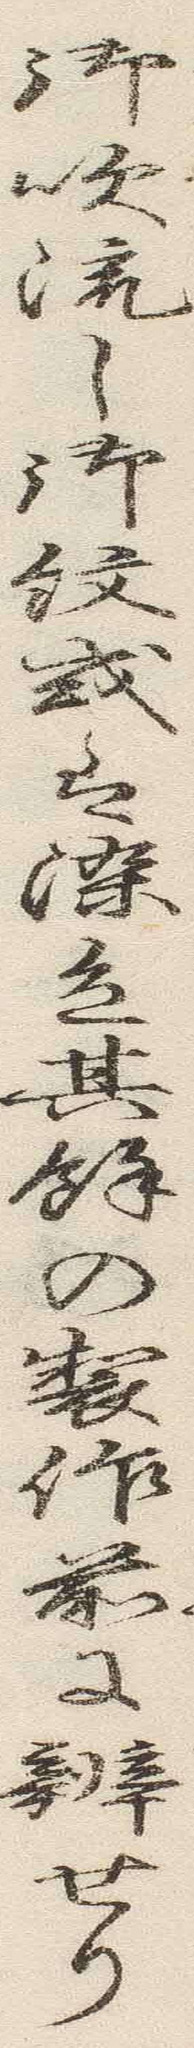御吹流し御紋或は染色其餘の製作前に辨せり
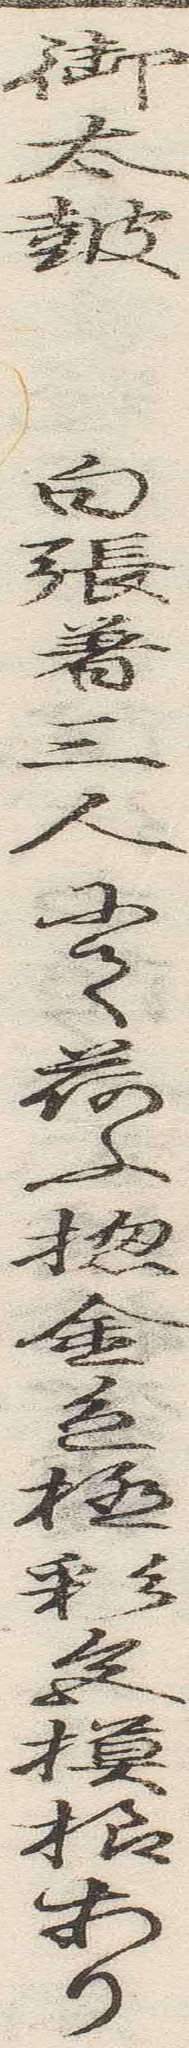御太皷白張着三人にて荷ふ揔金色極彩色摸様あり
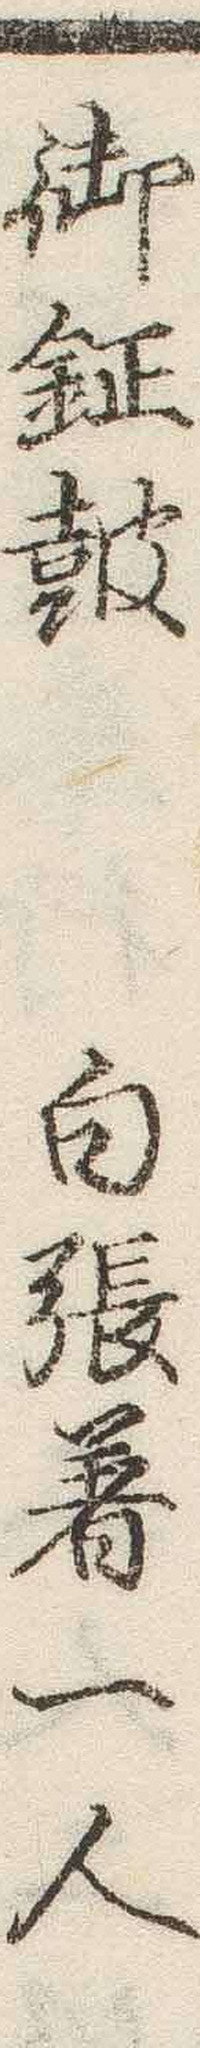御鉦皷白張着一人
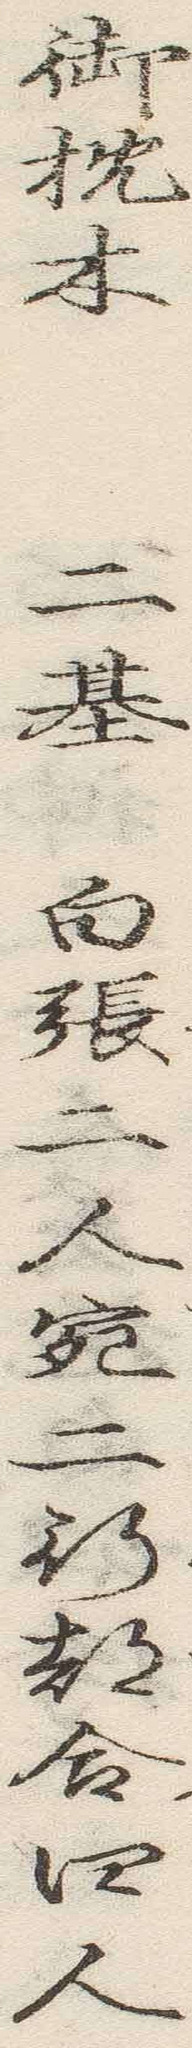御枕木二基白張二人宛二行都合四人
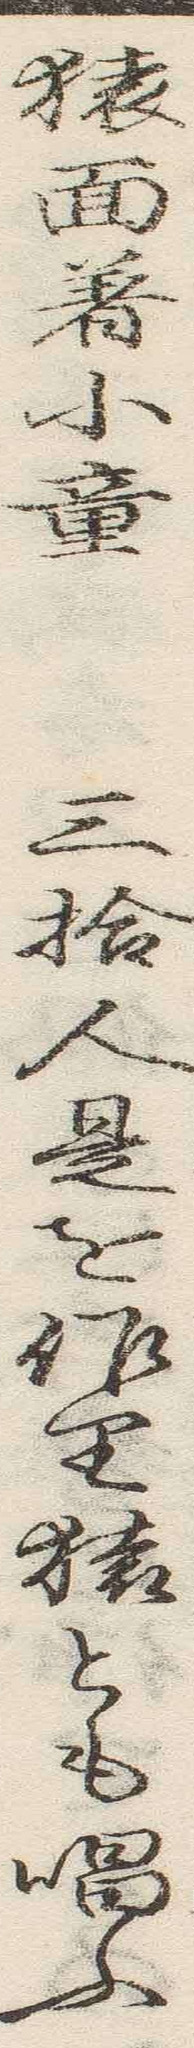猿面着小童三拾人是を作り猿とも唱ふ
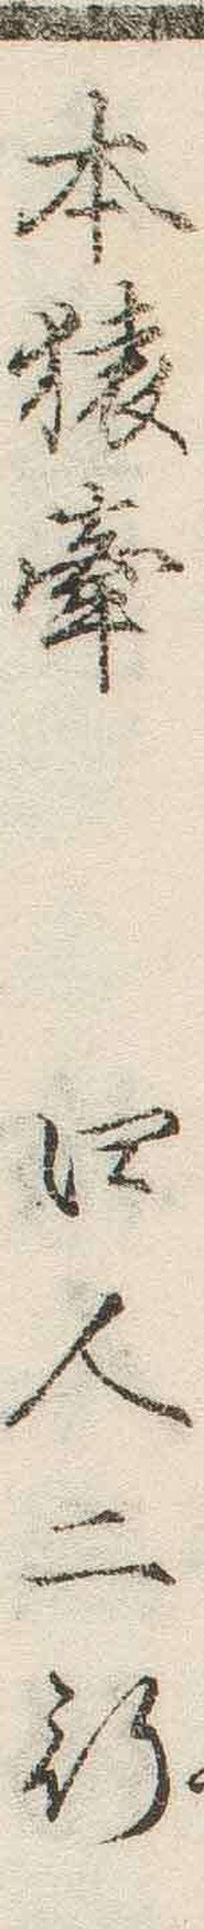本猿牽四人二行
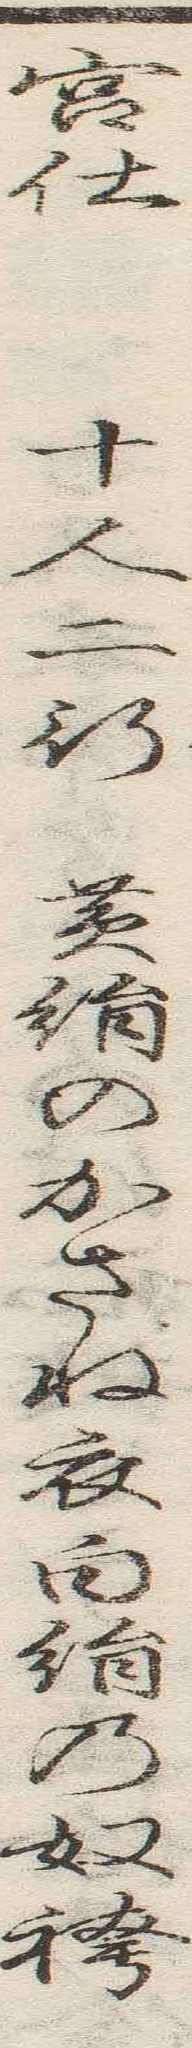宮仕十人二行黄絹のかさね衣白絹の奴袴
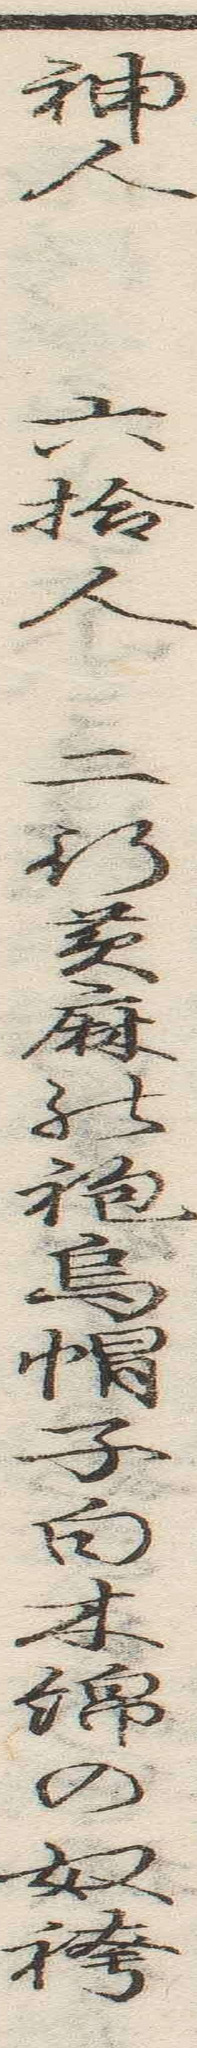神人六拾人二行黄麻の袍烏帽子白木綿の奴袴
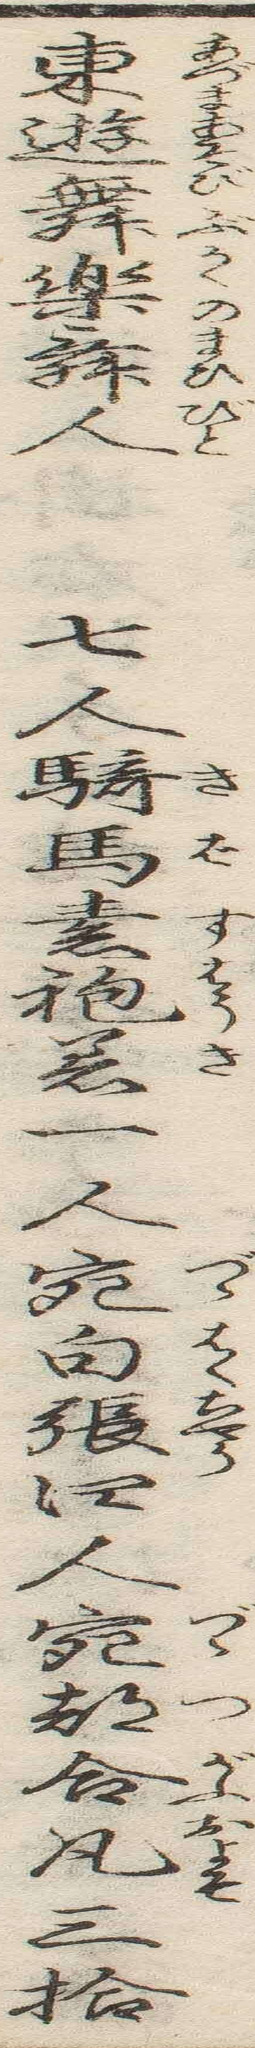東逰舞樂舞人七人騎馬素袍着一人宛白張四人宛都合凡三拾
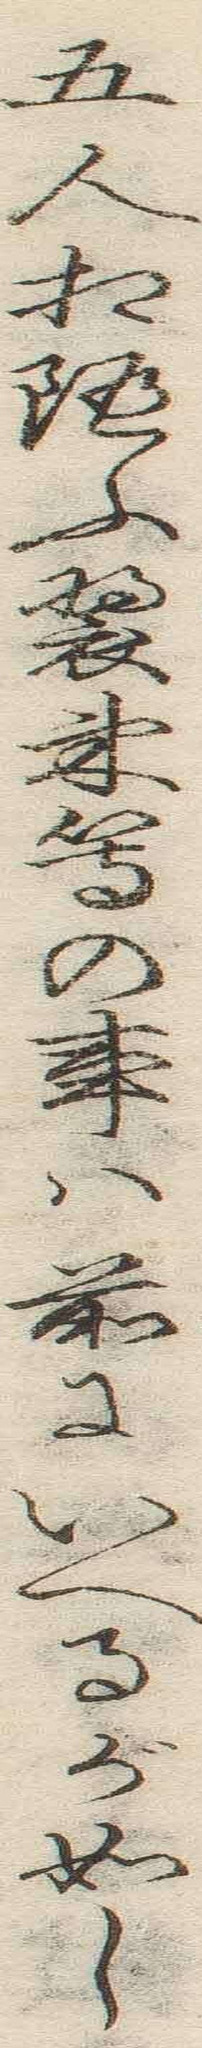五人相随ふ装束等の事は前にいへるが如し
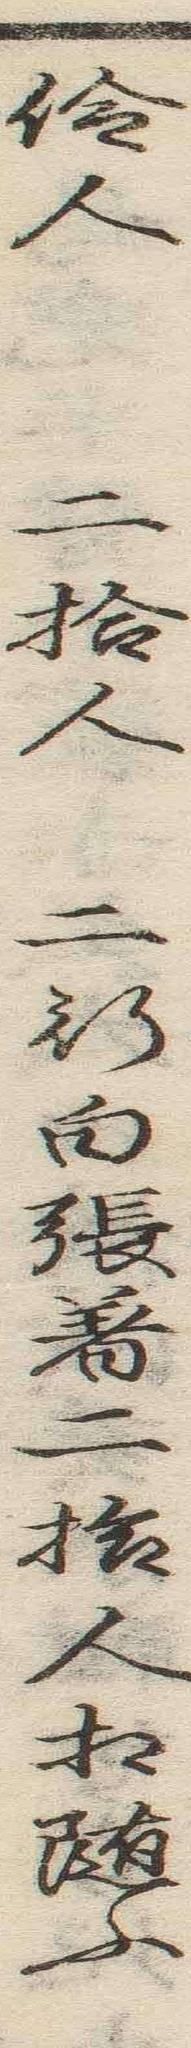伶人二拾人二行白張着二拾人相随ふ
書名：日光山志
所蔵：東京学芸大学附属図書館 国文学研究資料館
